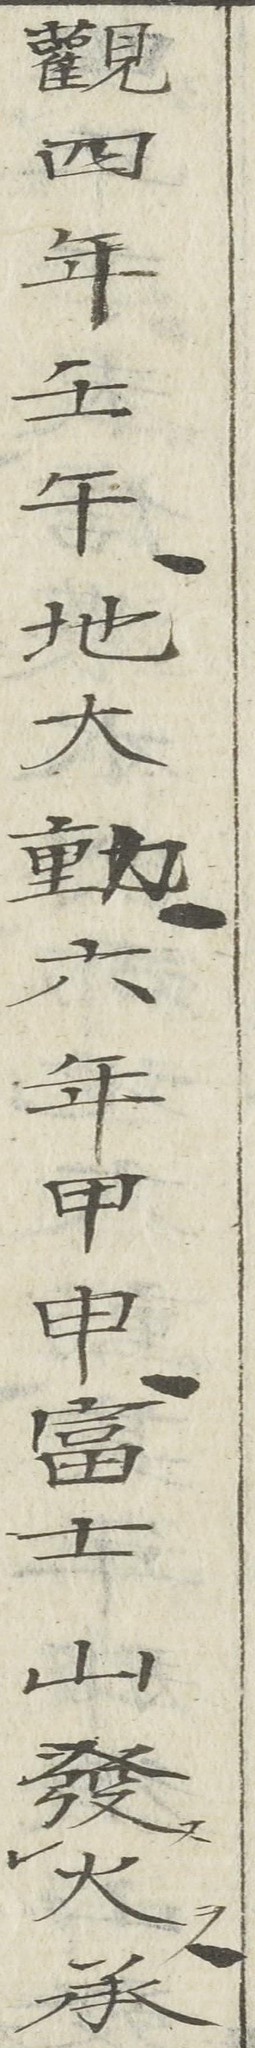観四年壬午、地大動、六年甲申、富士山発火、承
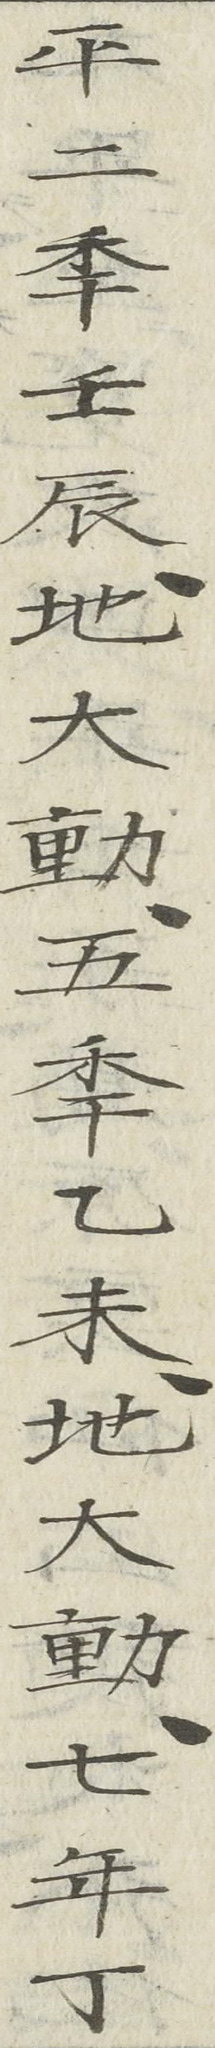平二年壬辰、地大動、五年乙未、地大動、七年丁
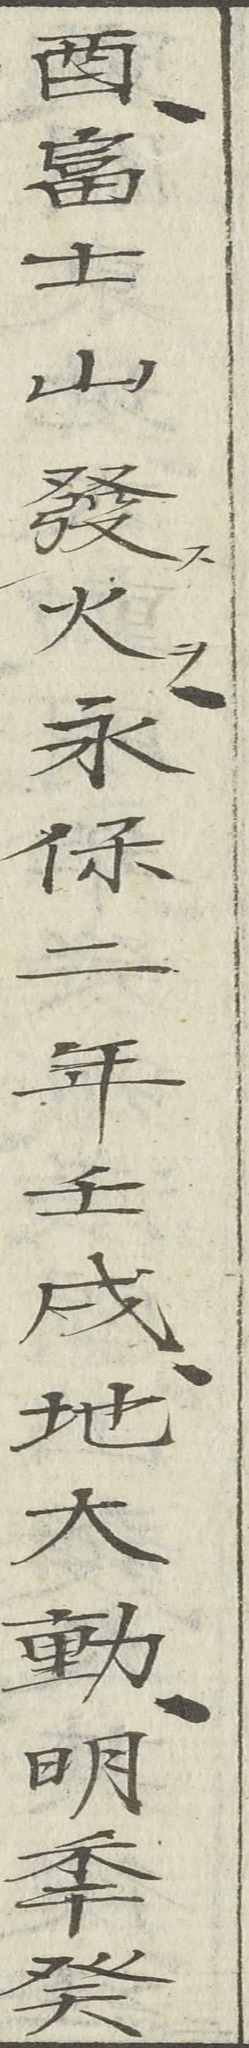酉、富士山発火、永保二年、地大動、明年癸
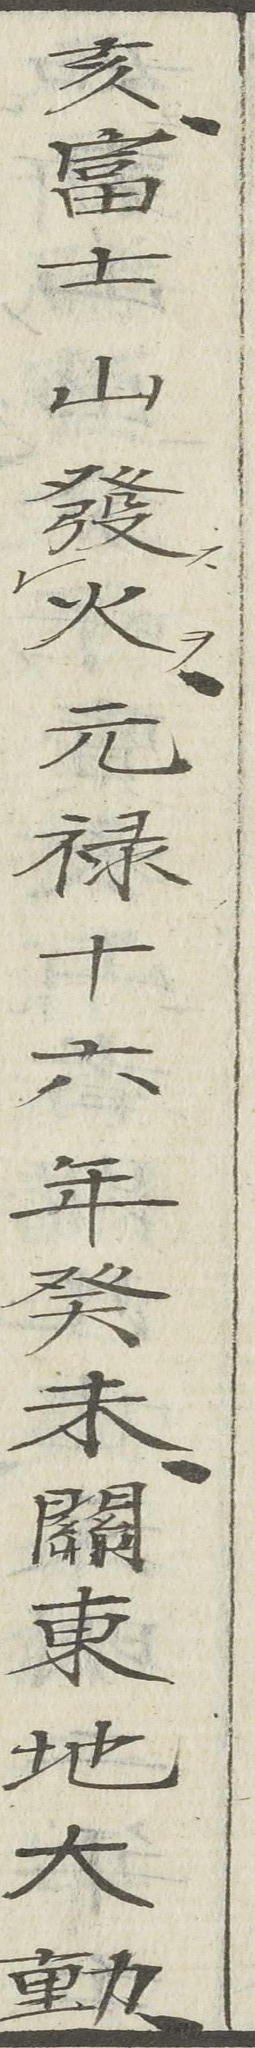亥、富士山発火、元禄十六年癸未、関東地大動、
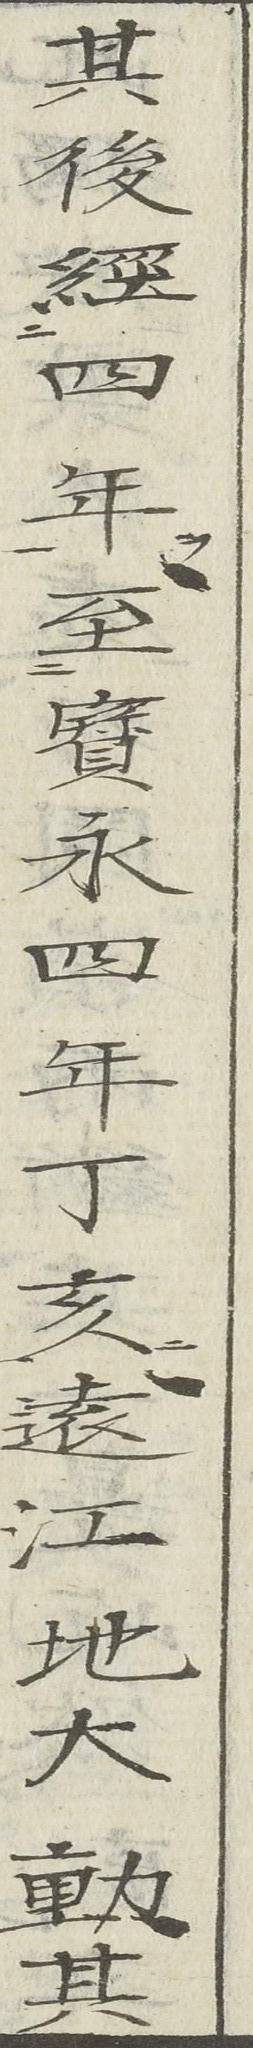其後経四年、至宝永四年丁亥、遠江地大動、其
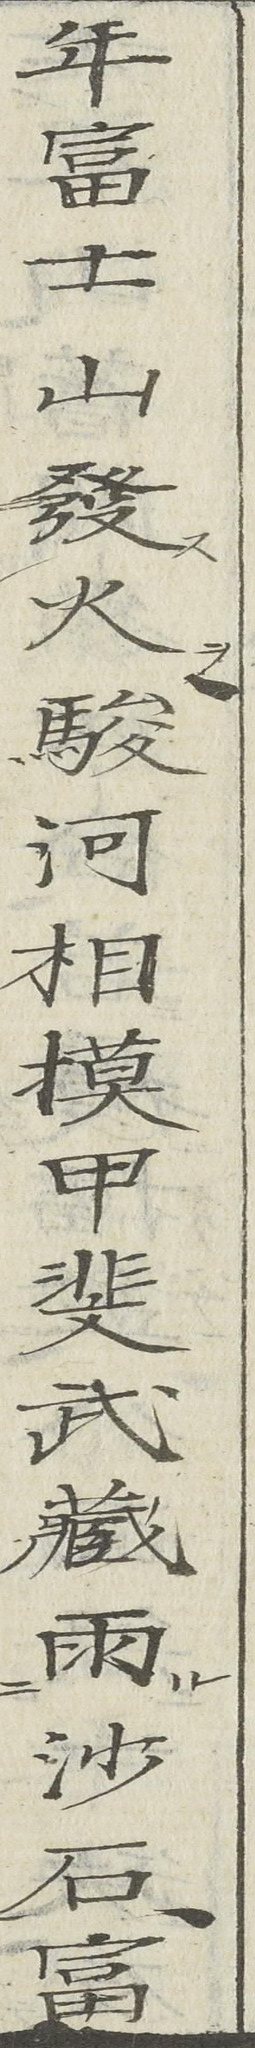年富士山発火、駿河相模甲斐武蔵雨沙石、富

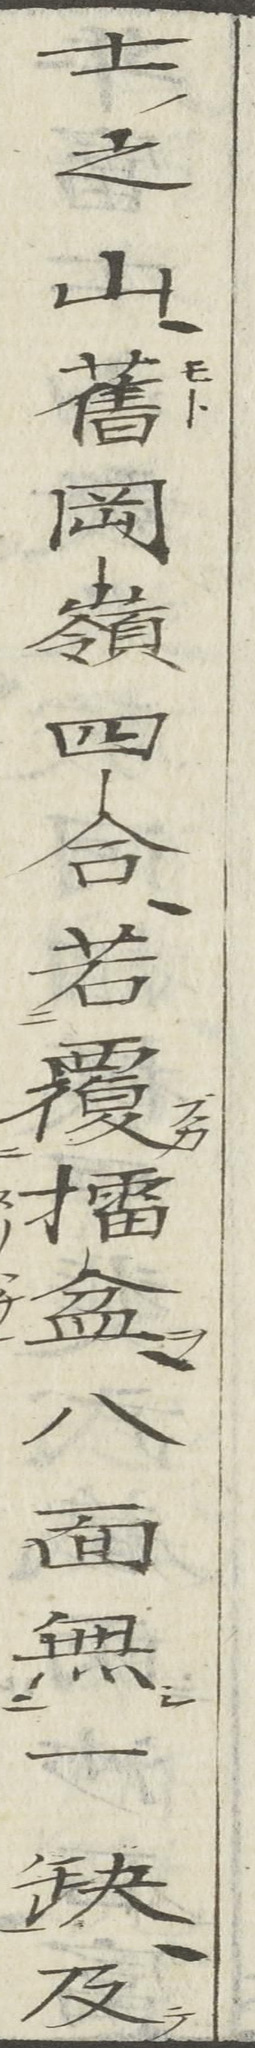士之山、旧岡嶺四合、若覆擂盆、八面無一玦、反
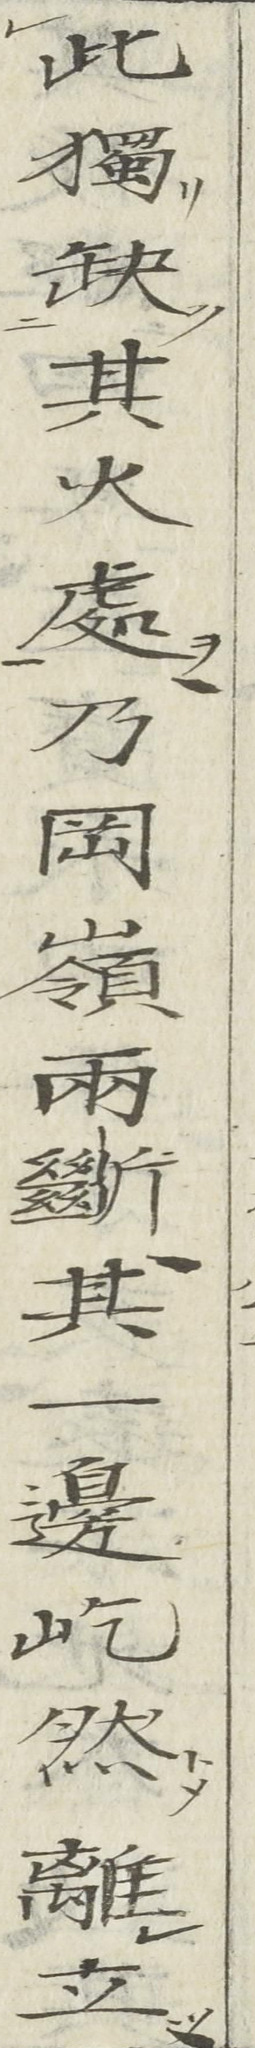此独缺其火処、乃岡嶺兩断、其一辺屹然離立
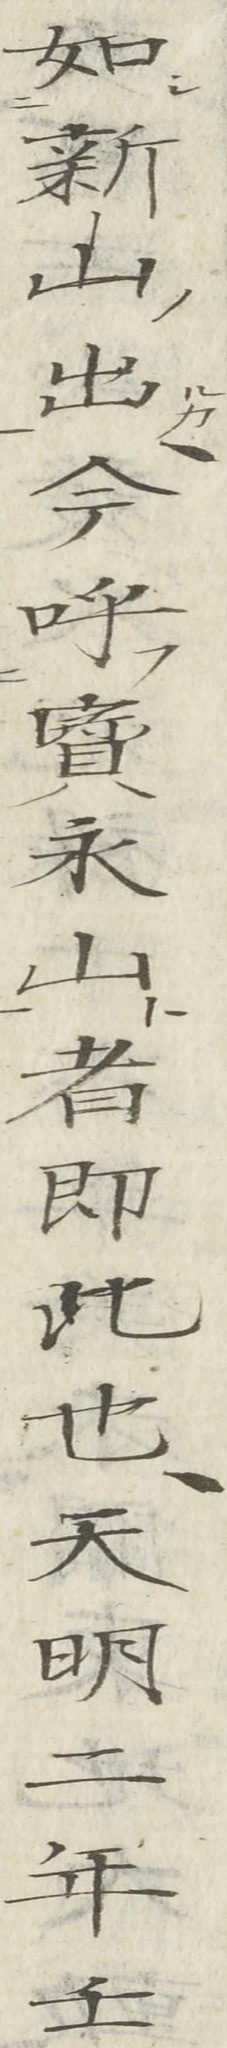如新山出、今呼宝永山者即此也、天明二年壬
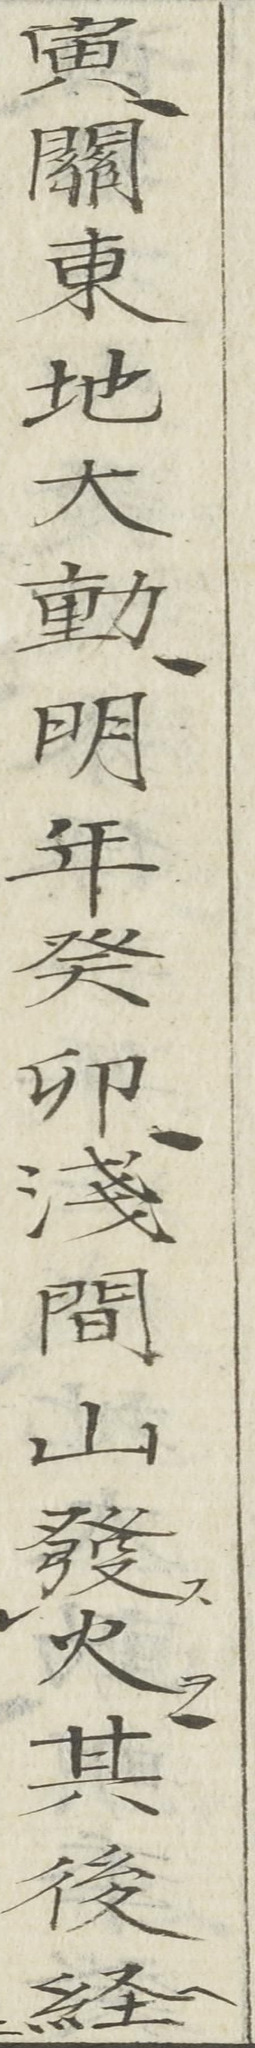寅、関東地大動、明年癸卯、浅間山発火、其後経
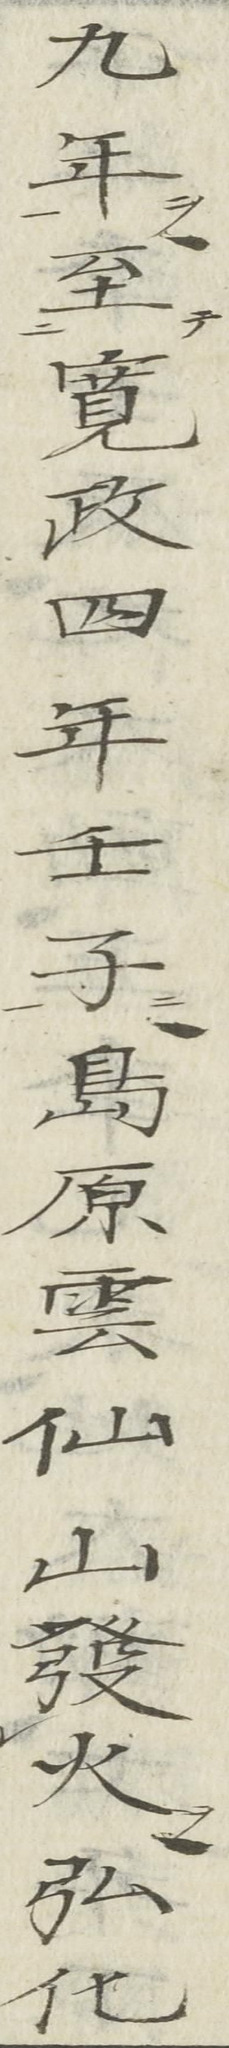九年、至寛政四年壬子、島原雲仙山発火、弘化
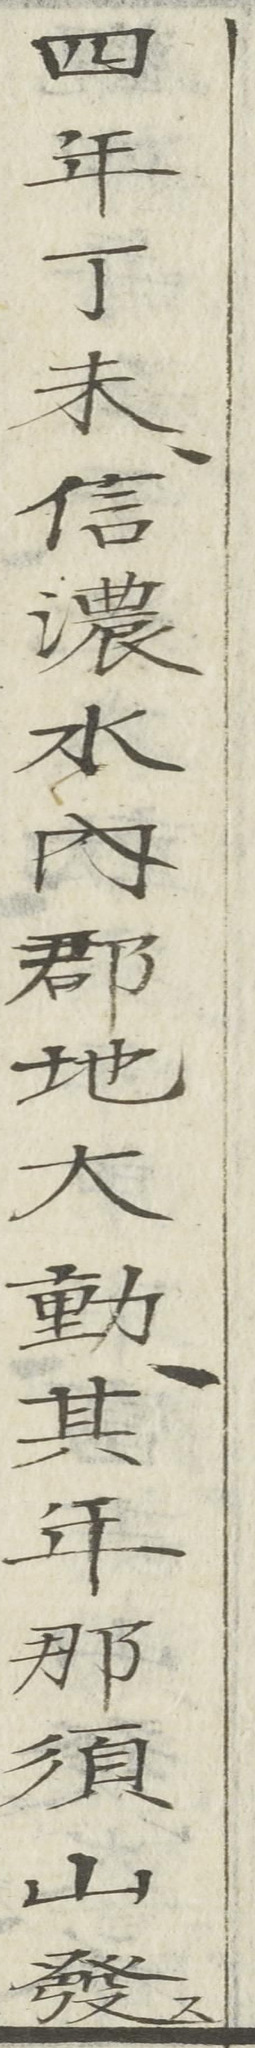四年丁未、信濃水内郡地大動、其年那須山発
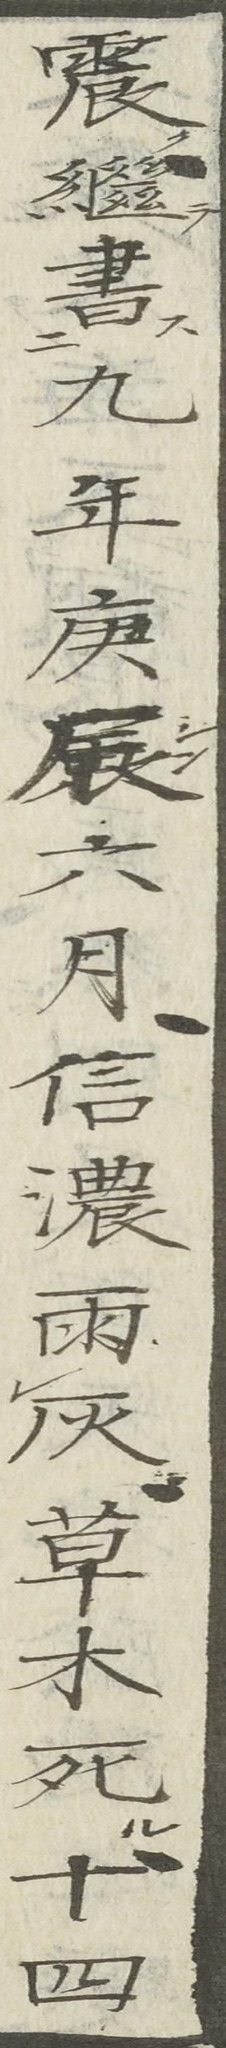震、継書九年庚辰六月、信濃雨灰、草木死、十四
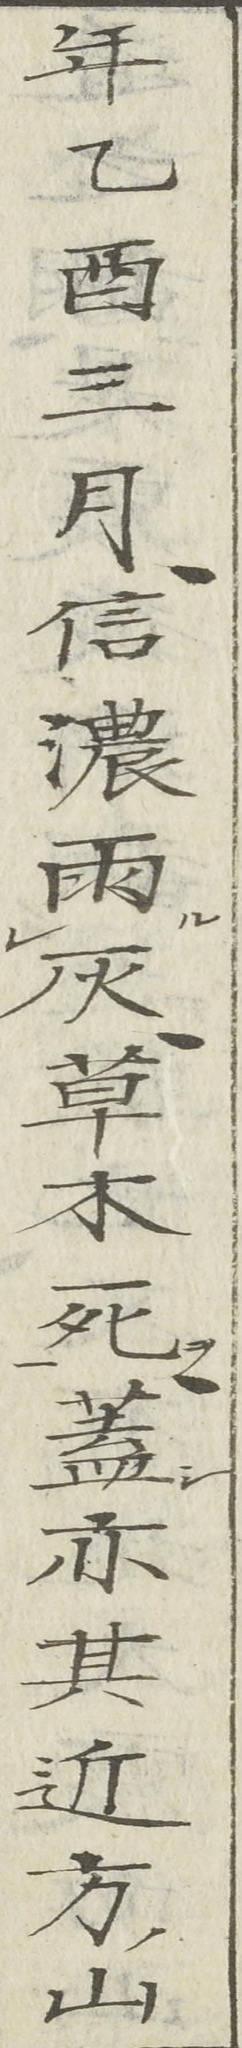年乙酉三月、信濃雨灰、草木死、蓋亦其近方山
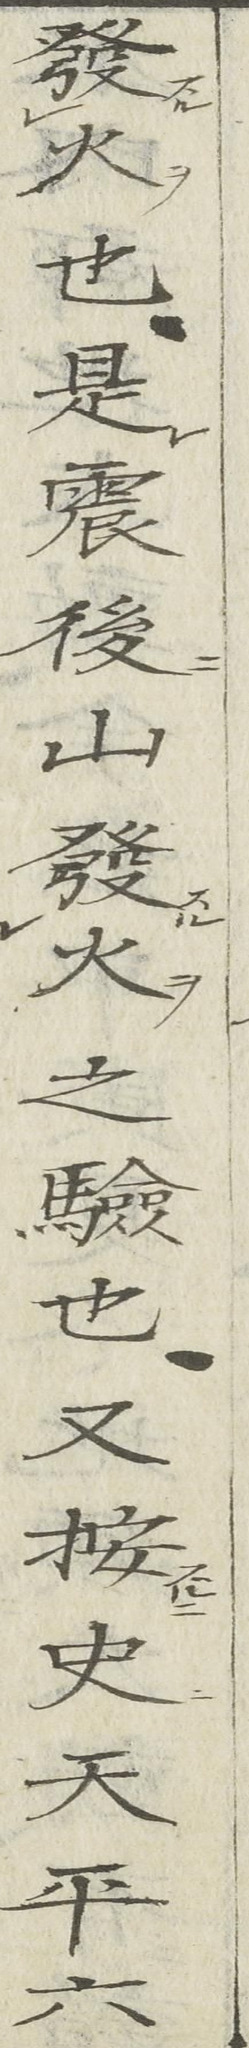発火也、是震後山発火之験也、又按史天平六
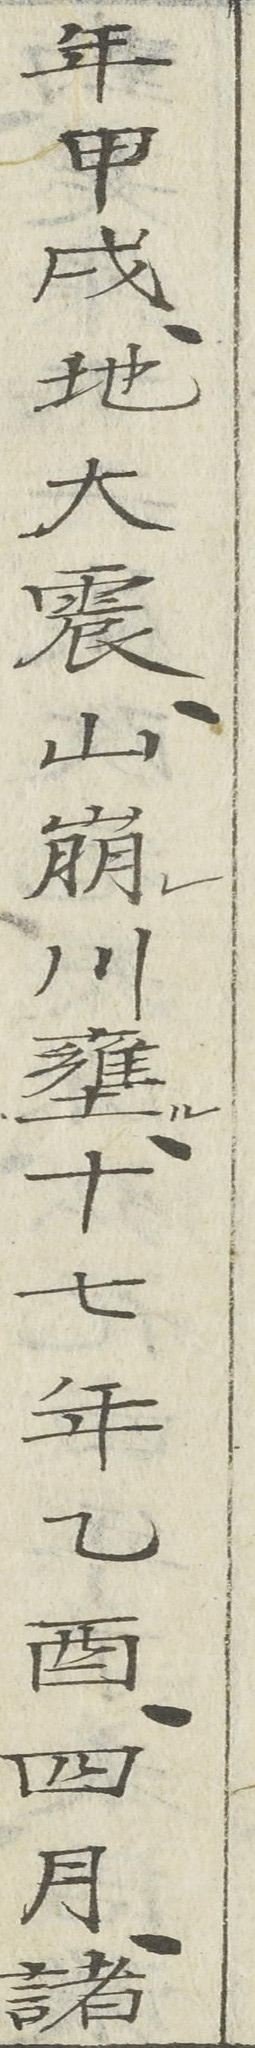年甲戌、地大震、山崩川壅、十七年乙酉、四月、諸
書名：海翻考　全
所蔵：東京大学地震研究所図書室 Earthquake Research Institute Library, The University of Tokyo, JAPAN
